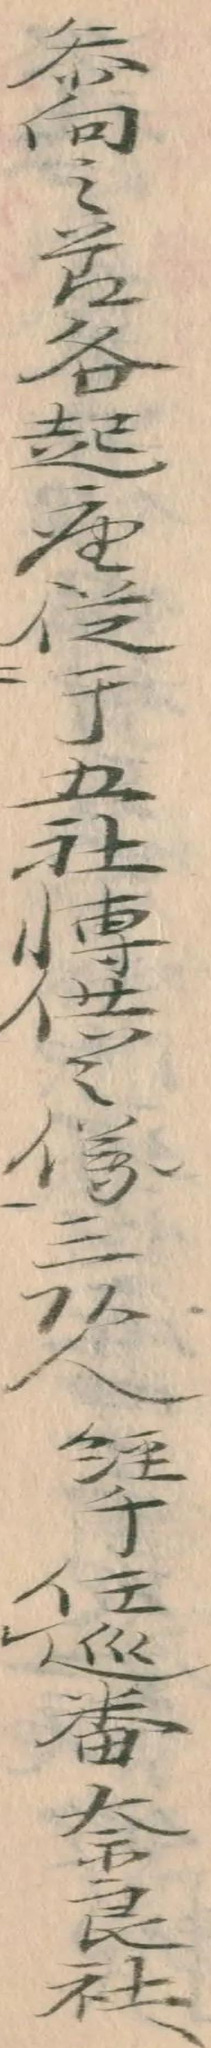参向之節各起座従于五社轉供之儀三頭人経千任巡番奈良社へ
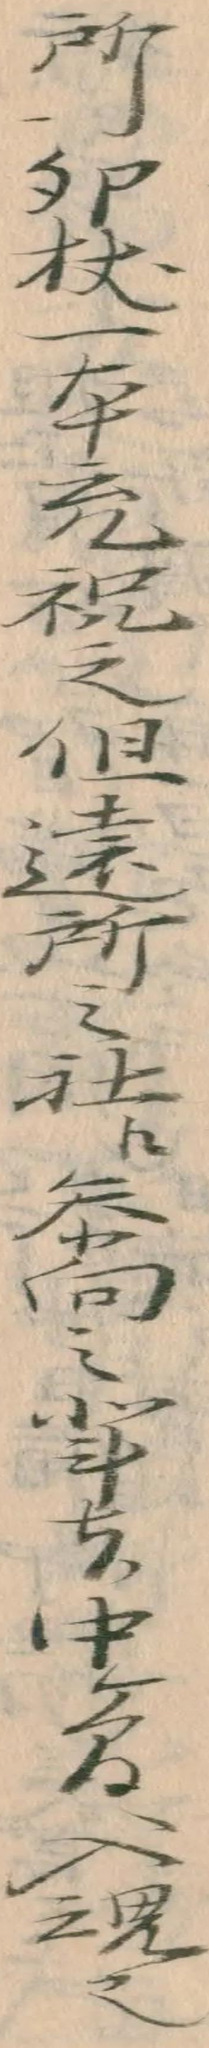所卯杖一本充祝之但遠所之社え参向之輩は中ヶ間へ入魂也
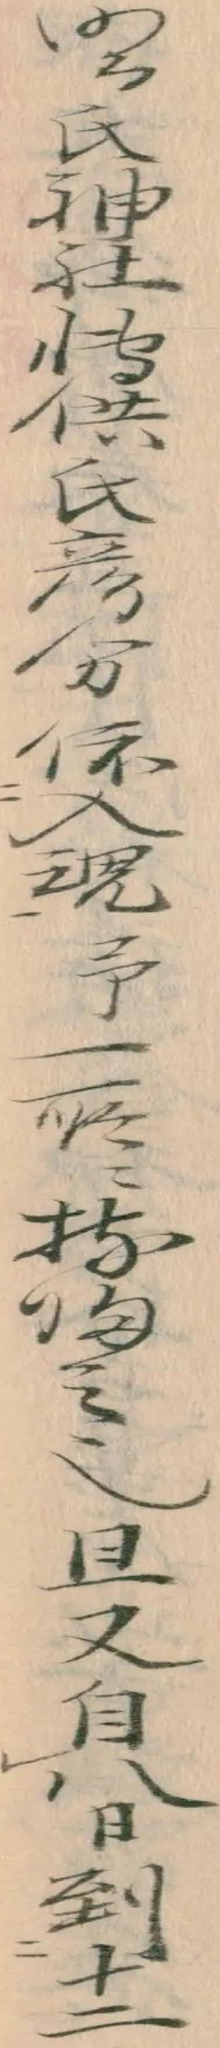仍而氏神社轉供氏彦分依入魂予一所ニ持帰之也且又自八日到十二
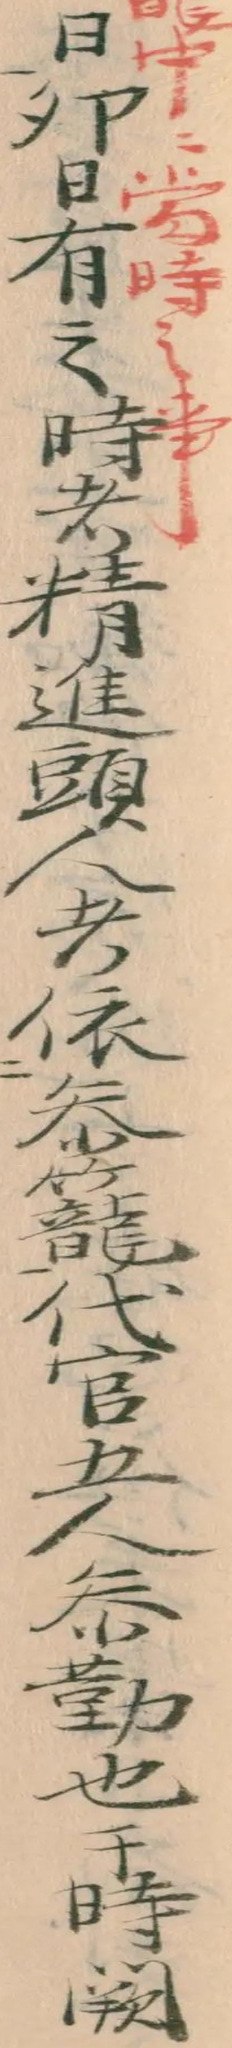日卯日有之時者精進頭人は依参籠代官五人参勤也于時闕
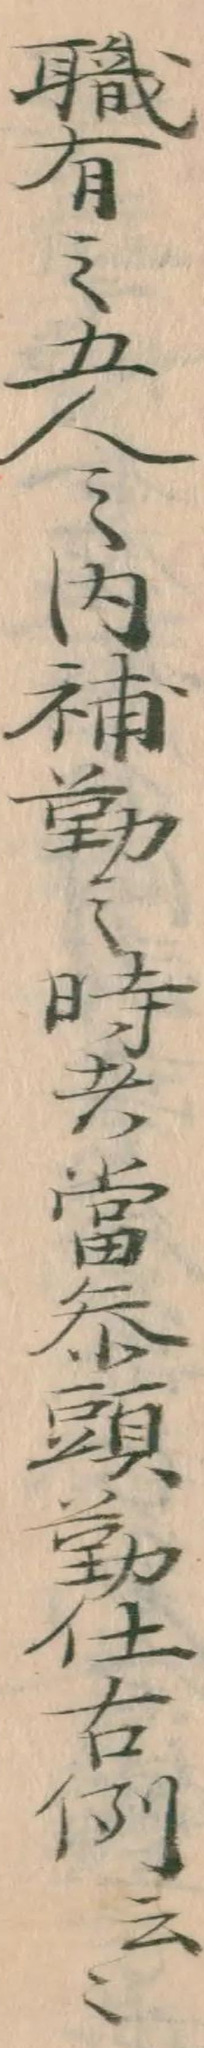職有之五人之内補勤之時者當参頭勤仕古例云々
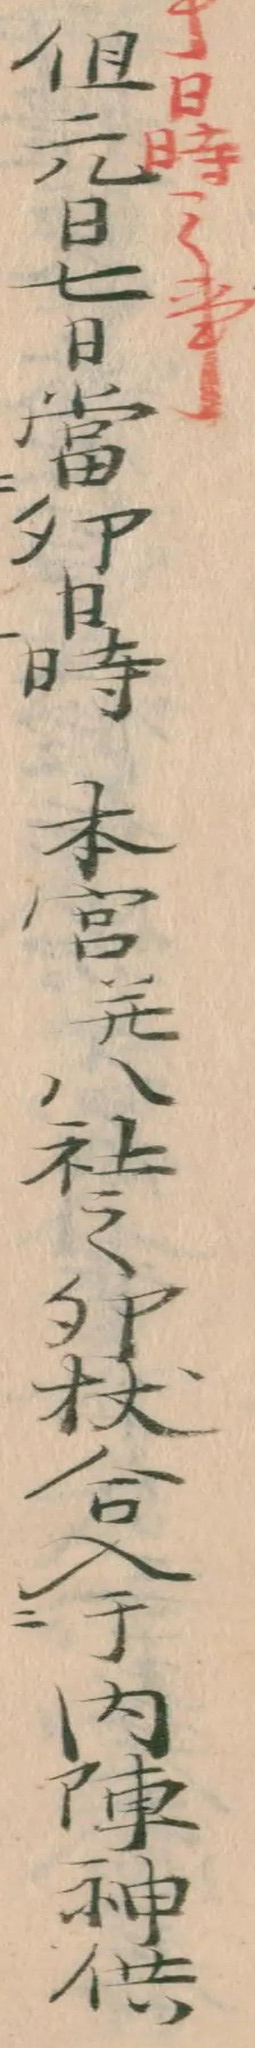但元日七日當卯日時本宮并八社之卯杖合入于内陣神供
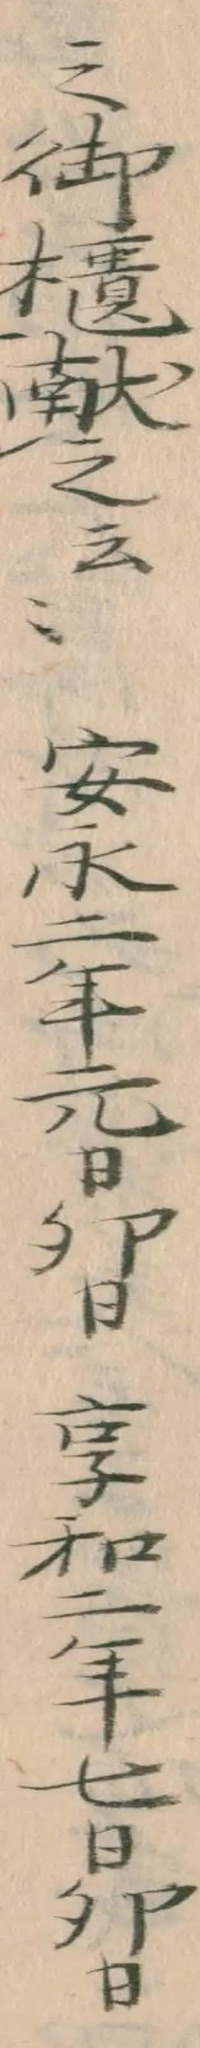之御櫃献之云〻安永二年元日卯日享和二年七日卯日
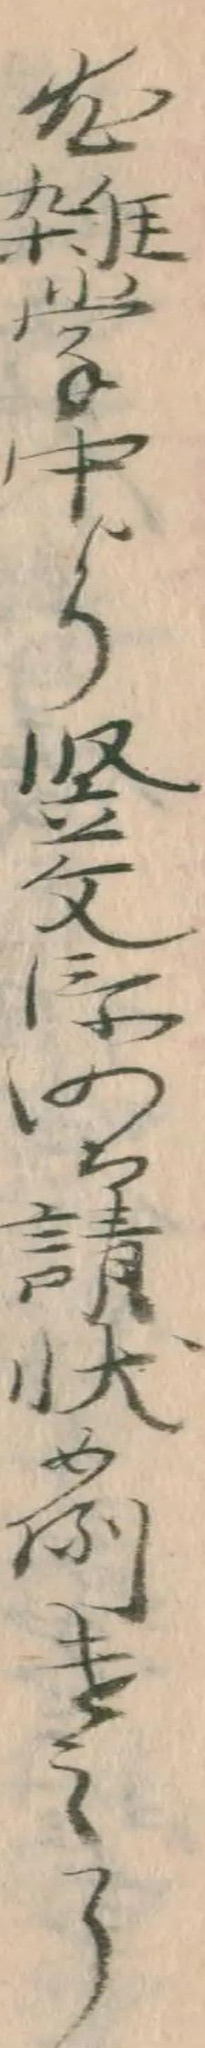尤雑掌中より竪文添仍而請状如例遣之了
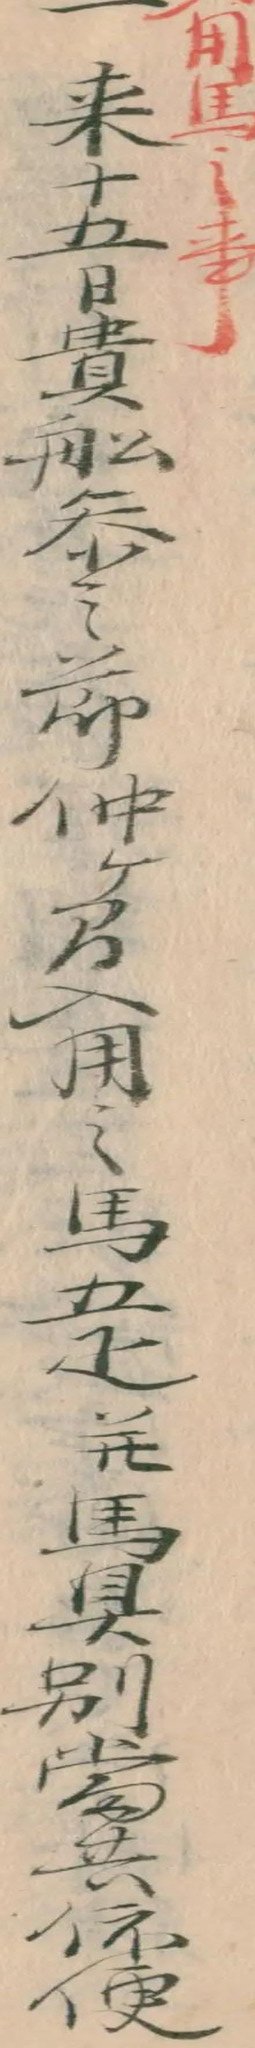一来十五日貴舩参之節仲ヶ間入用之馬五疋并馬具別當共依便
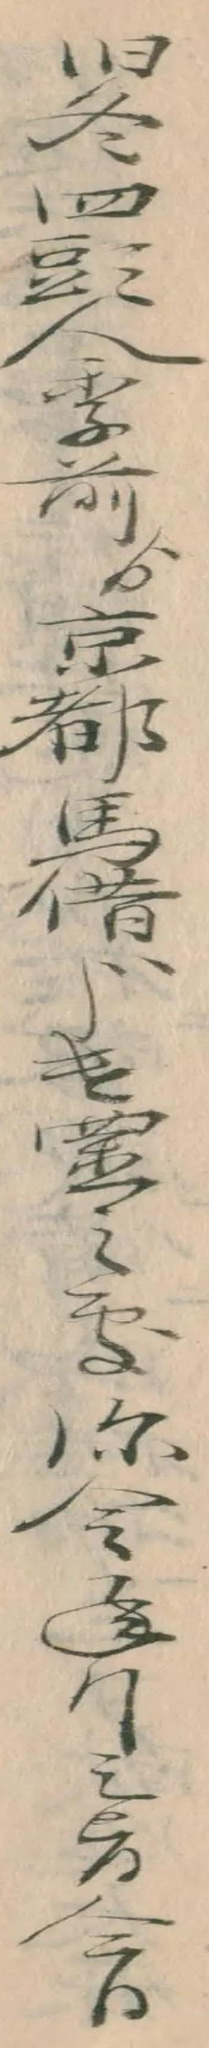旧冬四頭人季前ゟ京都馬借ハ申遣置之處令年引之旨今日
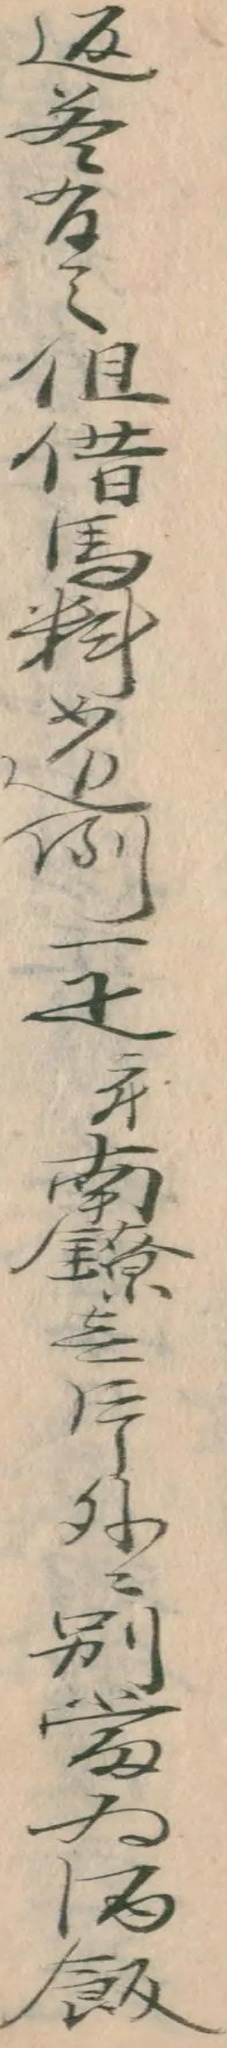返答有之但借馬料如近例一疋ニ付南鐐三片外ニ別当為酒飯
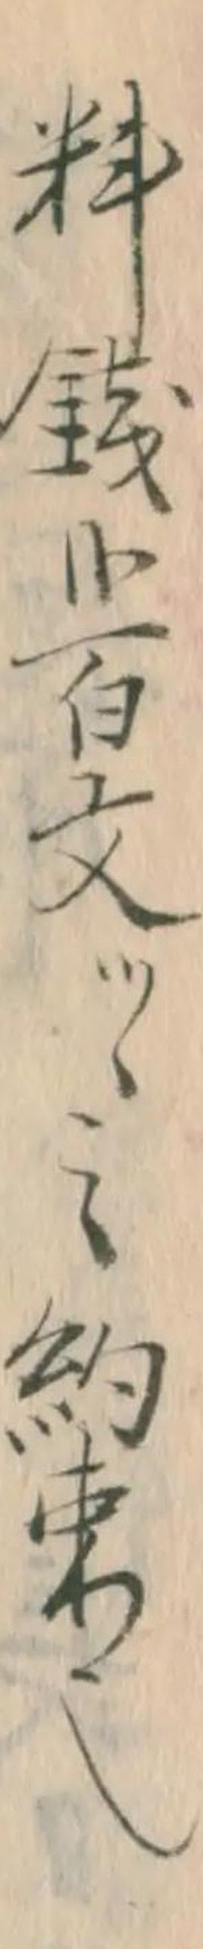料銭弐百文ツヽ之約束也

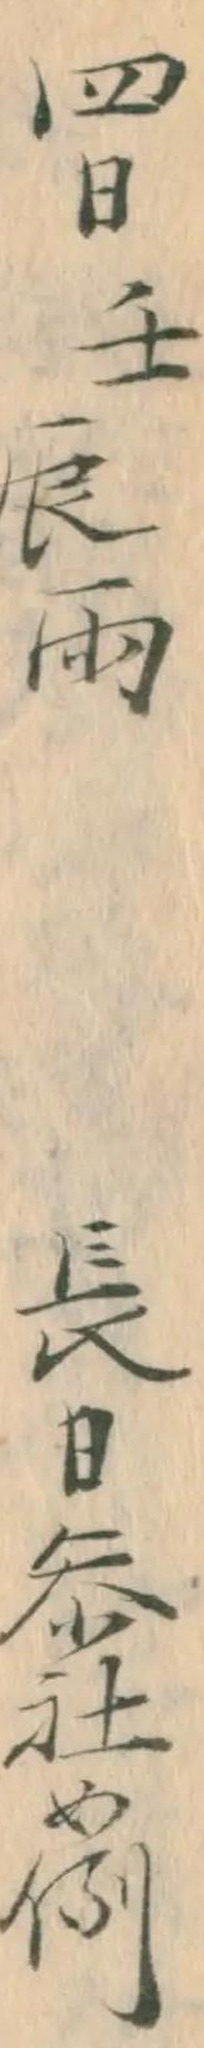四日壬亥雨長日参社如例
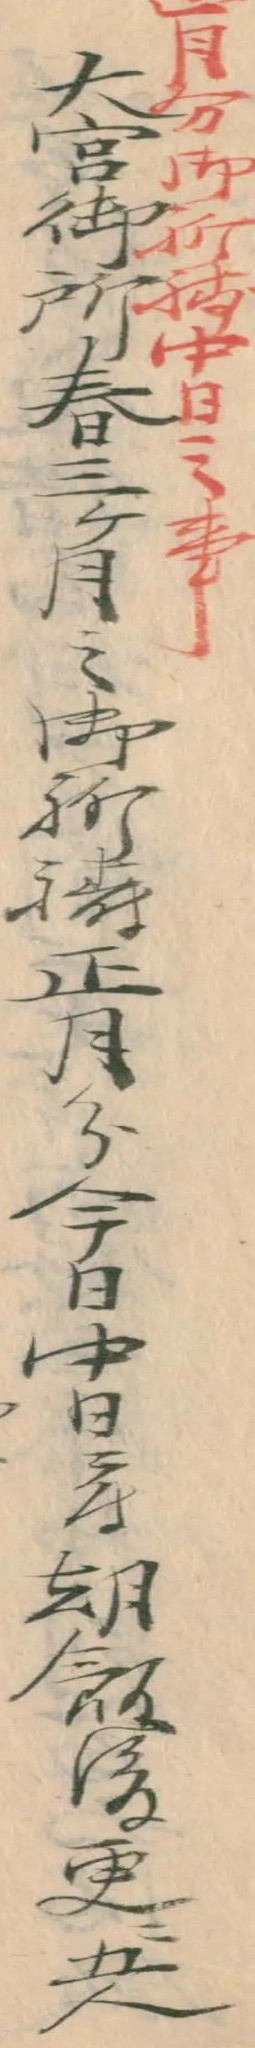一大宮御所春三ヶ月之御祈祷正月分今日中日ニ付朝飯後更ニ五人
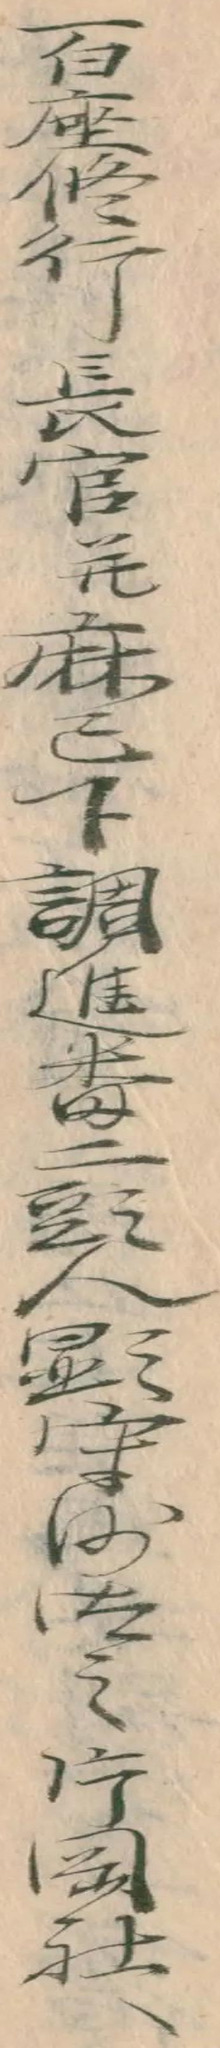百座修行長官并麻已下調進番二頭人顕守沙汰之片岡社へ
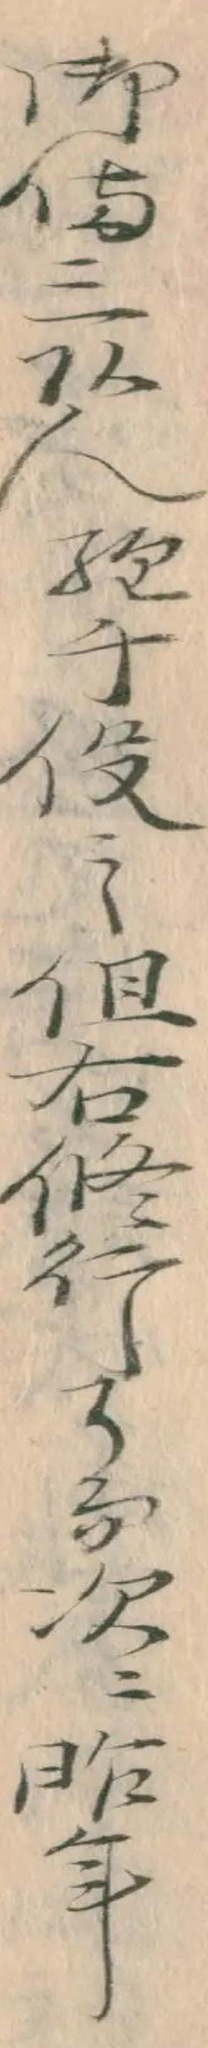御備三頭人経千役之但右修行了而次ニ昨年
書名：賀茂社記録. 第74冊
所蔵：国立国会図書館 National Diet Library, JAPAN
